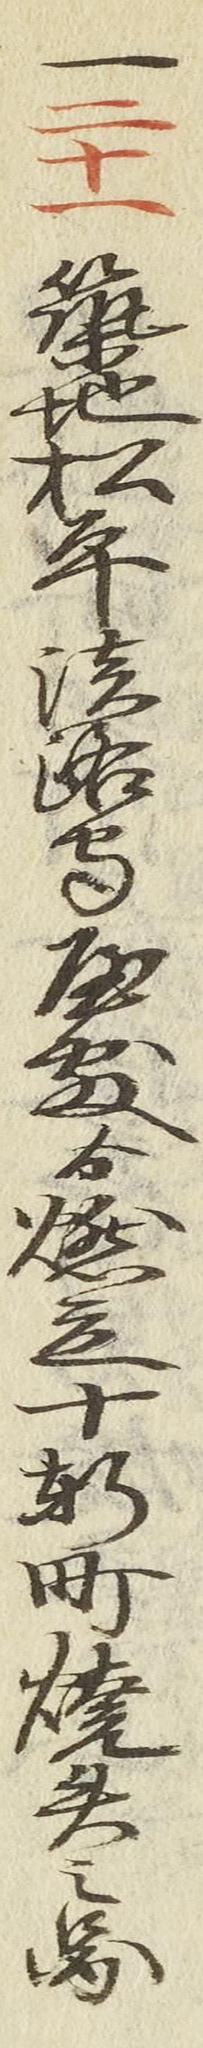一築地松平淡路守屋敷ゟ燃立十軒町焼失之図
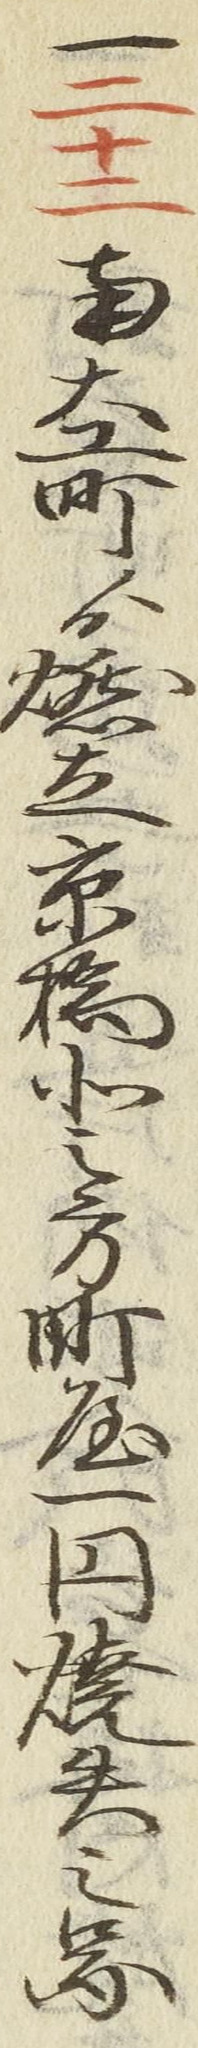一南大工町ゟ燃立京橋北之方町屋一円焼失之図
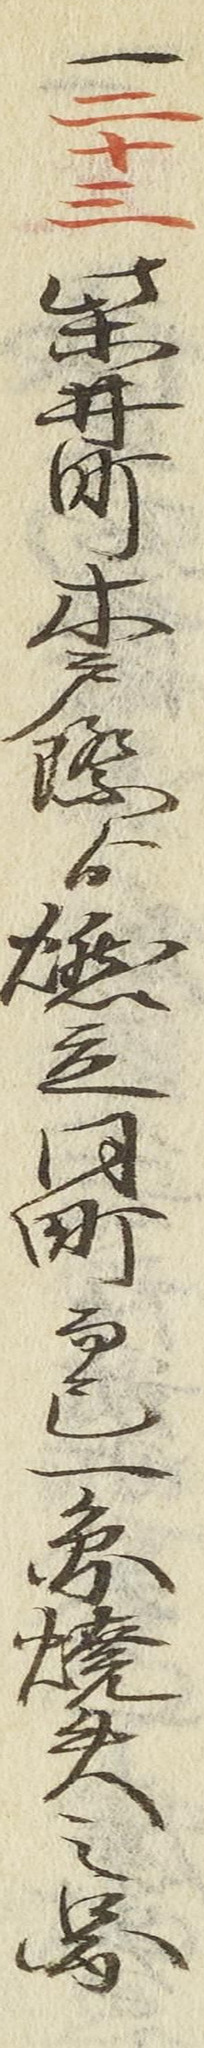一柴井町木戸際ゟ燃立同町而已一円焼失之図
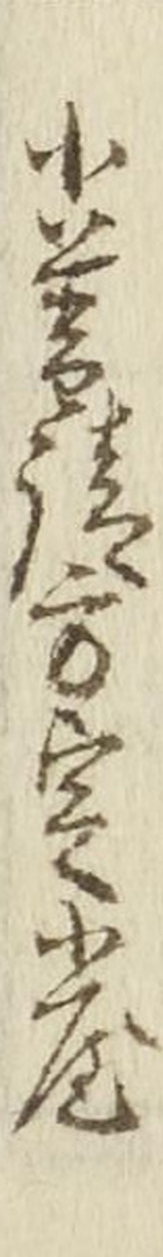御普請方定小屋

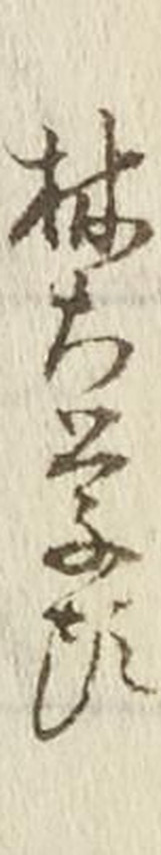林大学頭
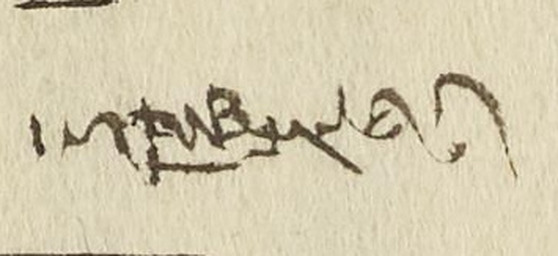馬場先御門

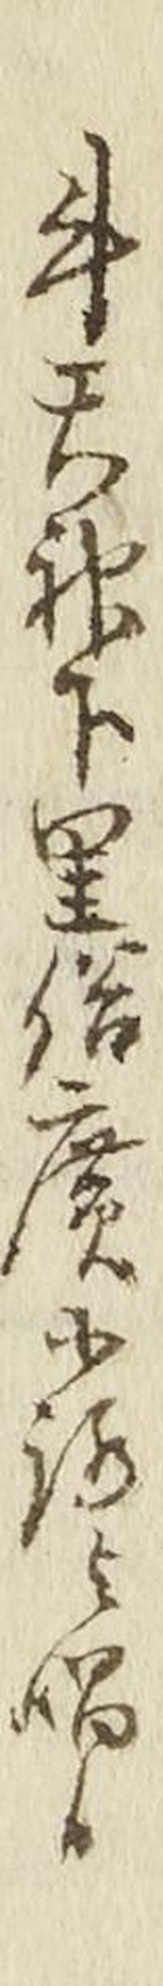牛天神下里俗広小路と唱候武士

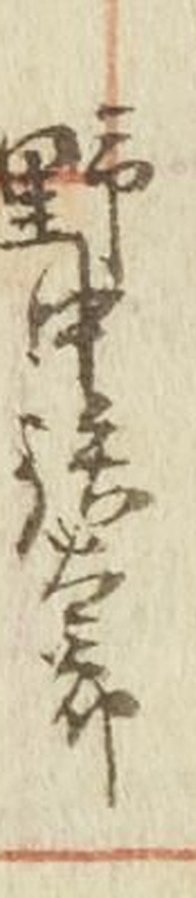野中鉄太郎
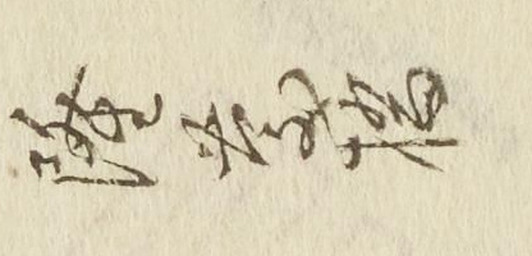隆慶橋
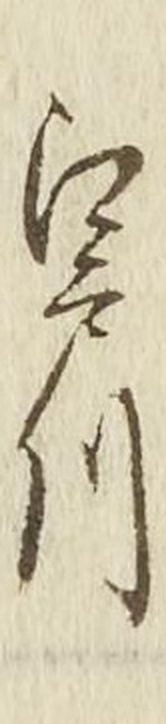江戸川

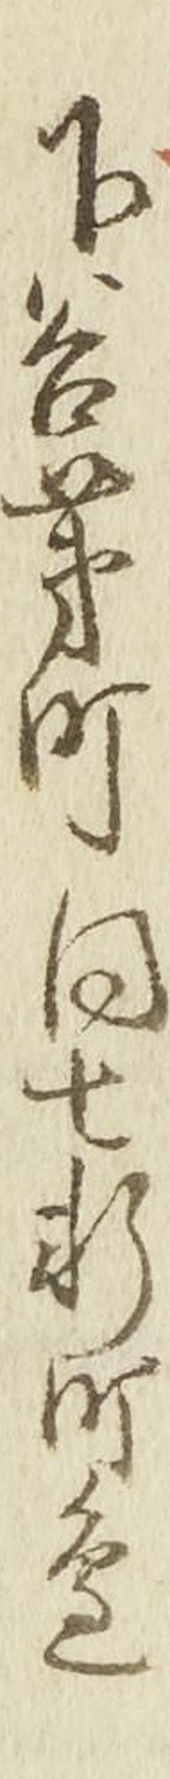下谷茅町同七軒町辺
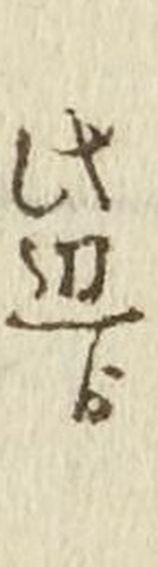此辺ゟ
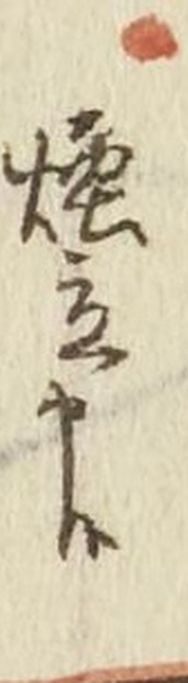煙立申候
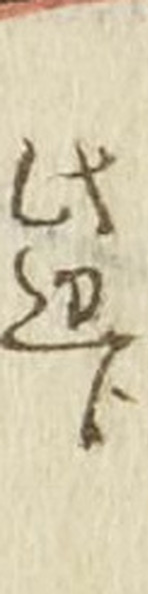此辺ゟ

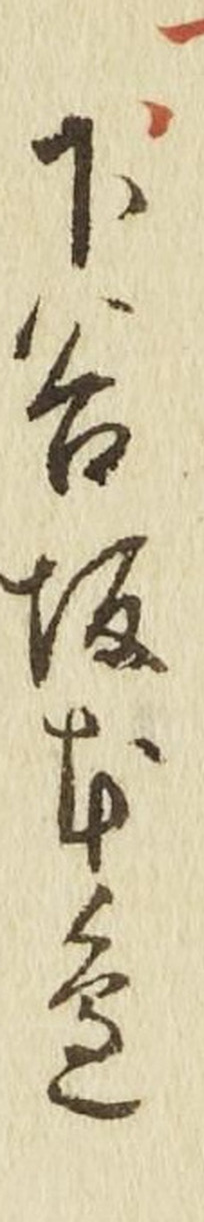下谷坂本辺
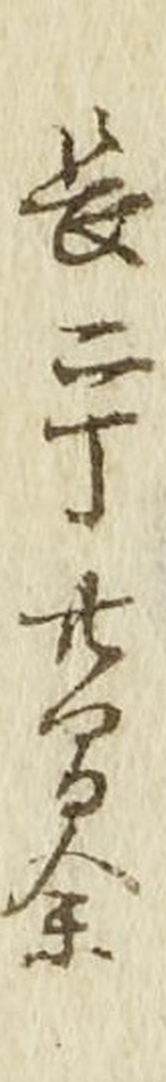長二丁廿間余
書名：安政二年震災記事　完
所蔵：東京大学地震研究所図書室 Earthquake Research Institute Library, The University of Tokyo, JAPAN
